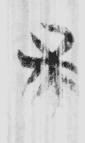求
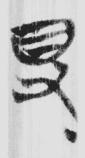{貝寸}
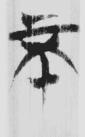不
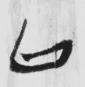㠯（以）
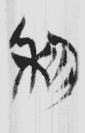利
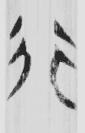行
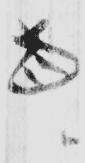直
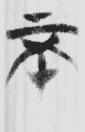不
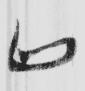㠯（以）
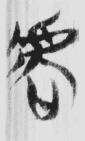唬
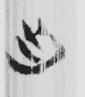出
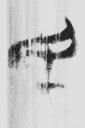民
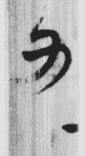力
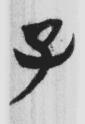子
